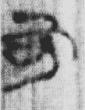可
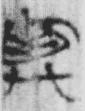與
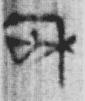和
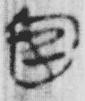安
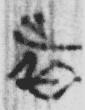者
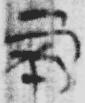不
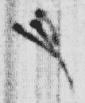又（有）
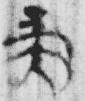夫
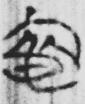奮
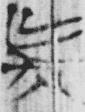拃（作）
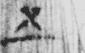之
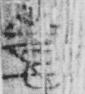情
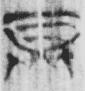鼎（則）
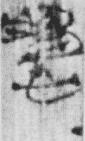○（侮）
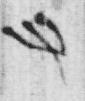又（有）
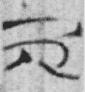亓（其）
